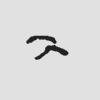氒
